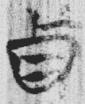貞
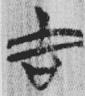吉
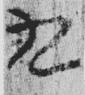九
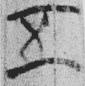五
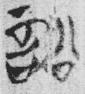訟
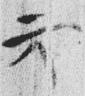元
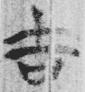吉
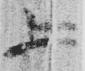上
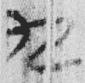九
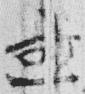或
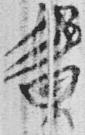賜
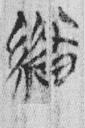○（鞶）
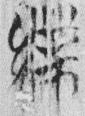○（帶）
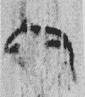夂（終）
